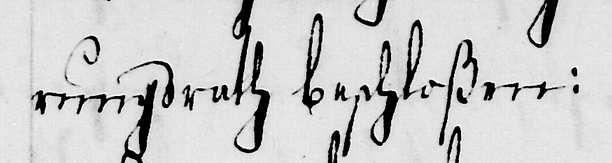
rungsrath beschloßen:
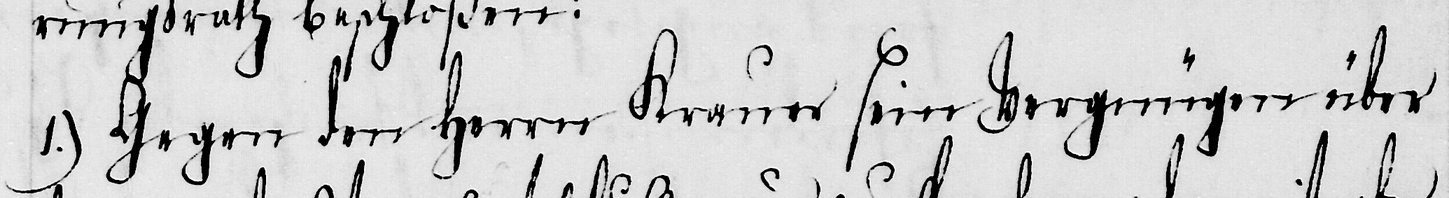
1.) Gegen den Herrn Krauer sein Vergnügen über
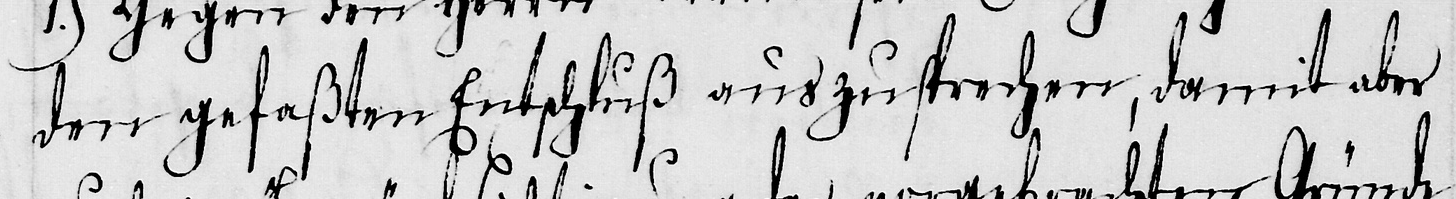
den gefaßten Entschluß auszusprechen, damit aber
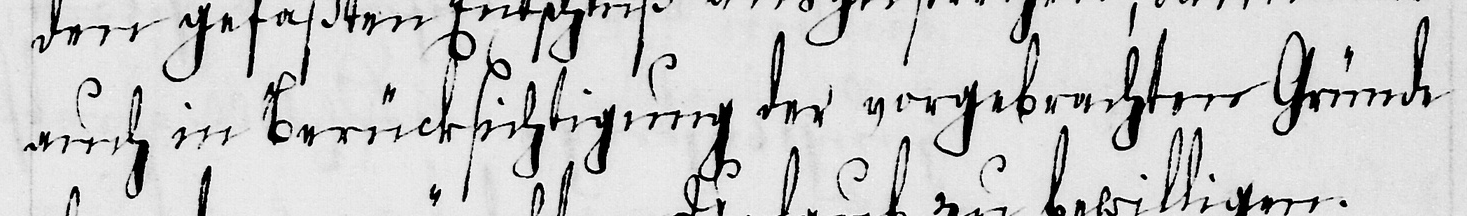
auch in Berücksichtigung der vorgebrachten Gründe
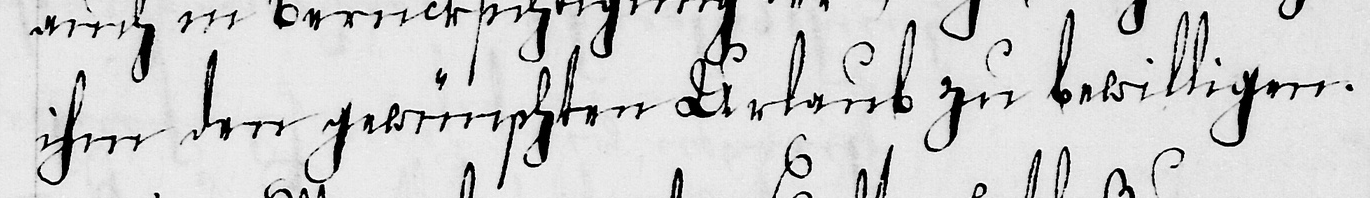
ihm den gewünschten Urlaub zu bewilligen.
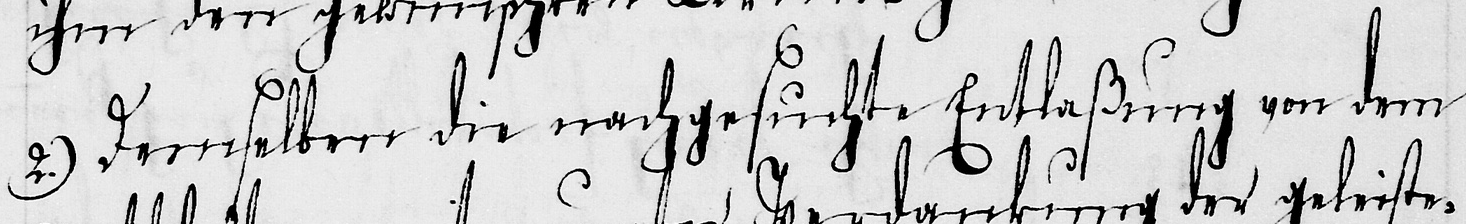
2.) Demselben die nachgesuchte Entlaßung von dem
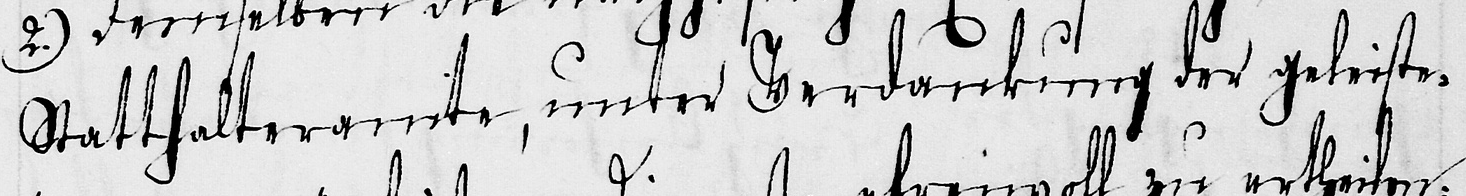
Statthalteramte, unter Verdankung der geleiste¬
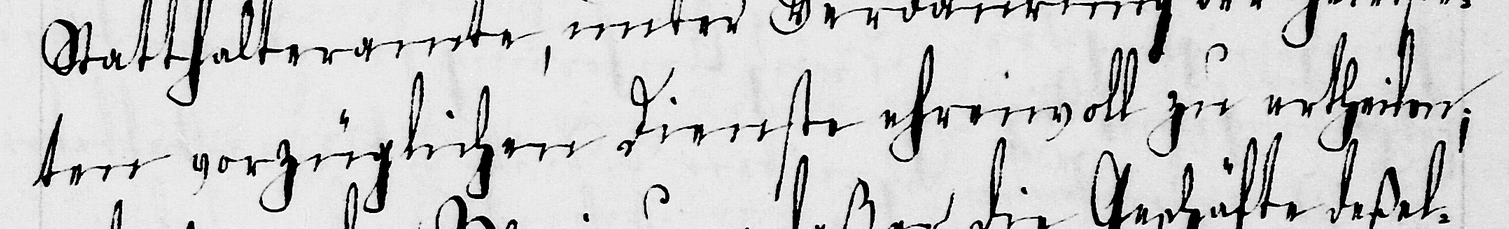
ten vorzüglichen Dienste ehrenvoll zu ertheilen;
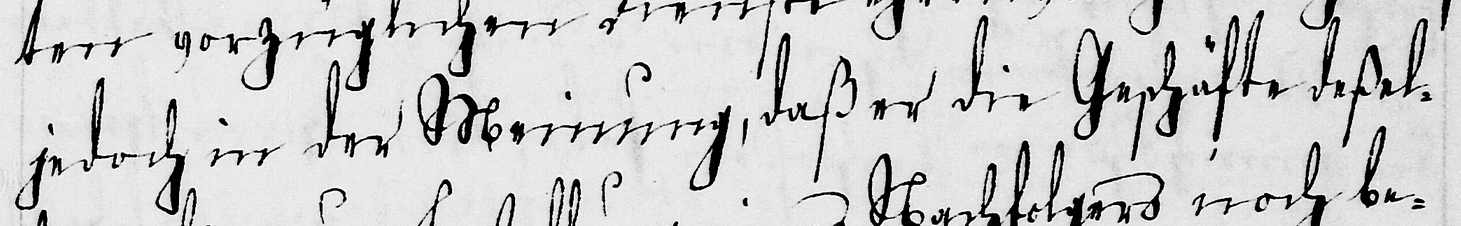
jedoch in der Meinung, daß er die Geschäfte deßel¬
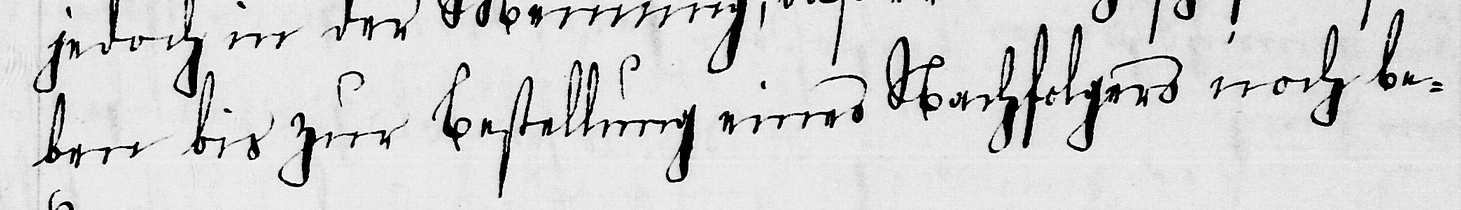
ben bis zur Bestellung eines Nachfolgers noch be¬
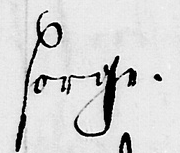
sorge.
